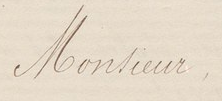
Monsieur,
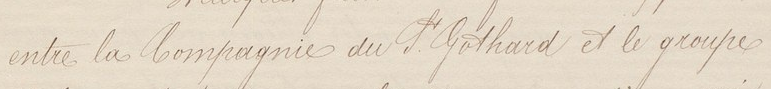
entre la Compagnie du St Gothard et le groupe
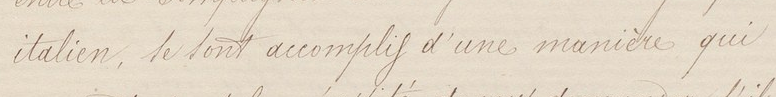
italien, se sont accomplis d'une manière qui
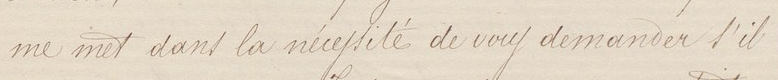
me met dans la nécessité de vous demander s'il
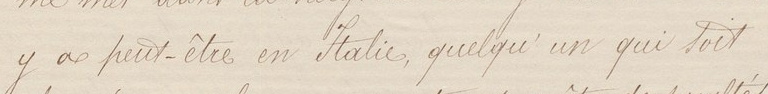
y a peut-être en Italie, quelqu'un qui soit
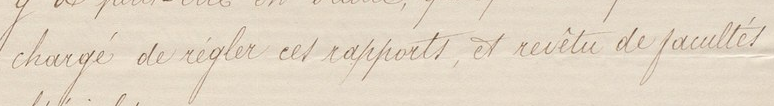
chargé de régler ces rapports, et revêtu de facultés
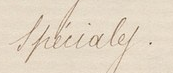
spéciales.
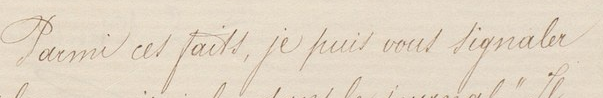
Parmi ces faits, je puis vous signaler
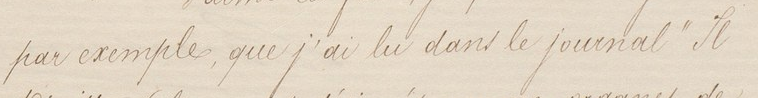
par exemple, que j'ai lu dans le journal «Il
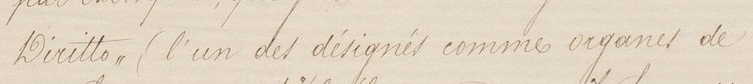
Diritto» (l'un des désignés comme organes de
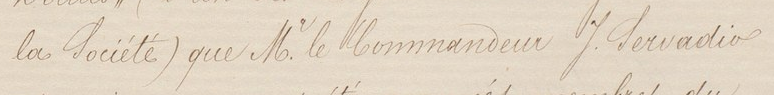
la Société) que Mr le Commandeur J. Servadio
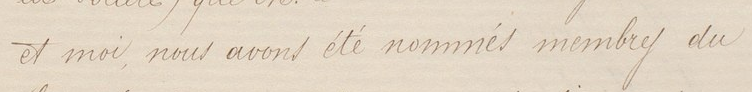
et moi, nous avons été nommés membres du
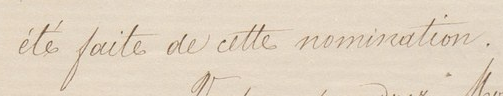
été faite de cette nomination.
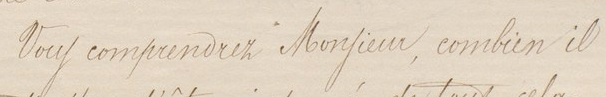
Vous comprendrez Monsieur, combien il
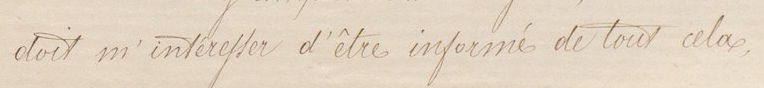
doit m'intéresser d'être informé de tout cela,
